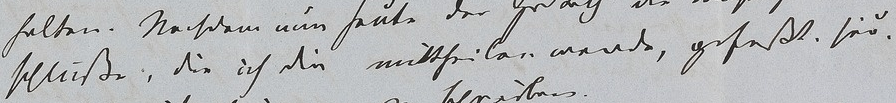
schlüße, die ich dir mittheilen werde, gefaßt, säu-
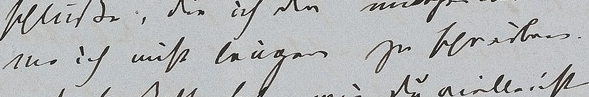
me ich nicht länger zu schreiben.
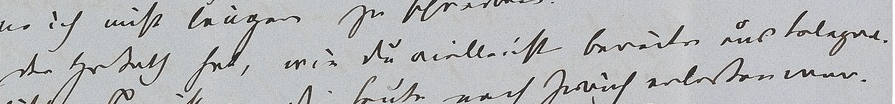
Der Gr Rath hat, wie du vielleicht bereits aus telegra-
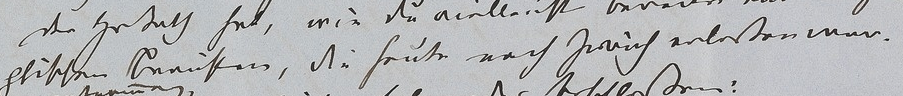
phischen Berichten, die heute nach Zürich erlaßen wor-
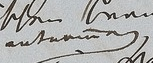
entnommen,
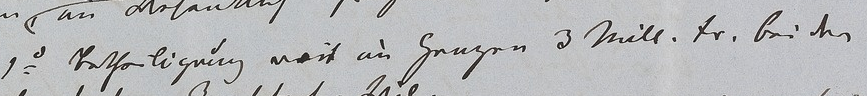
1o Betheiligung mit im Ganzen 3 Mill. Fr. bei der
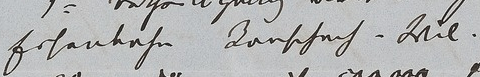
Eisenbahn Rorschach–Wil.
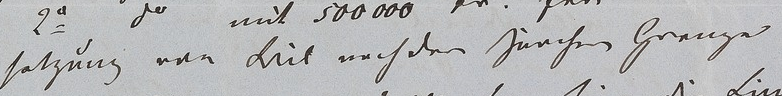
setzung von Wil nach der Zürcher Grenze
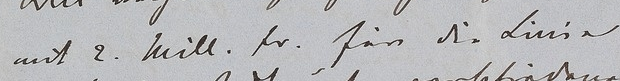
mit 2. Mill. Fr. für die Linie
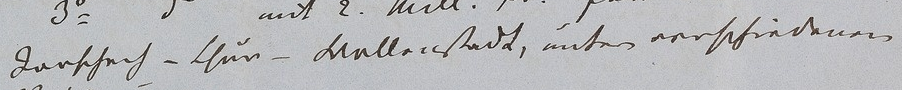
Rorschach–Chur–Wallenstadt, unter verschiedenen
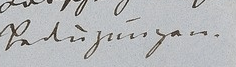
Bedingungen.
